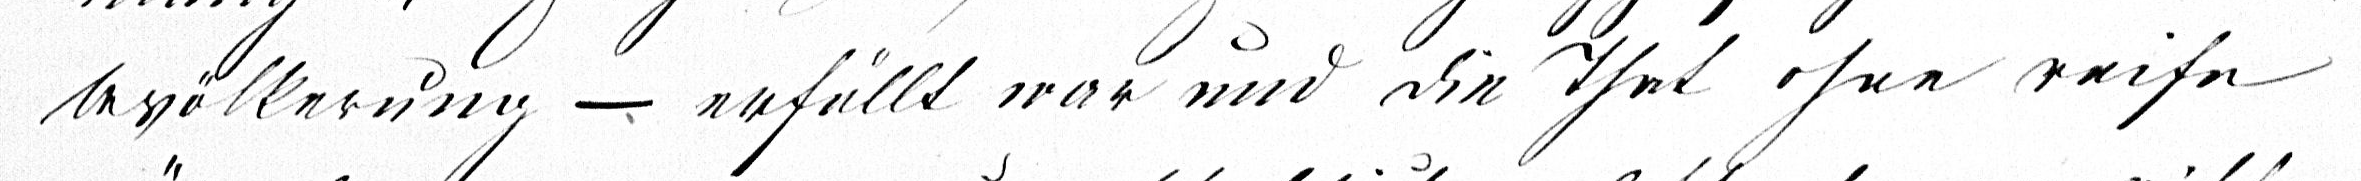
bevölkerung - erfällt war und die That ohne reife
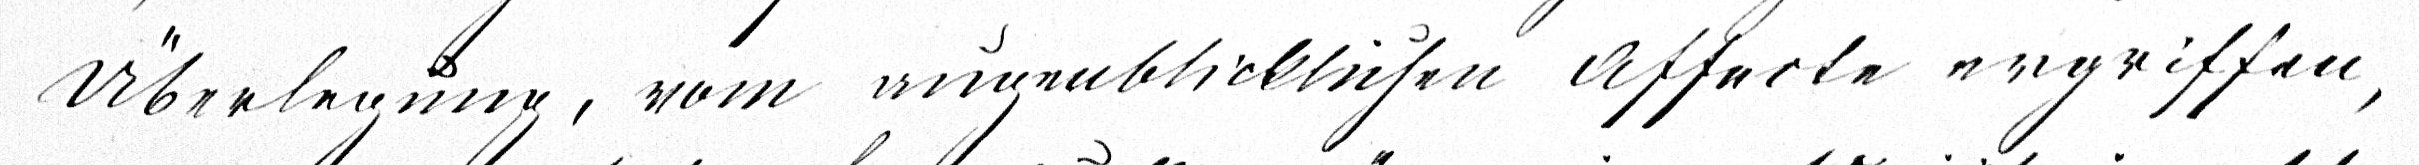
Überlegung, vom augenblicklichen Affecte ergriffen,
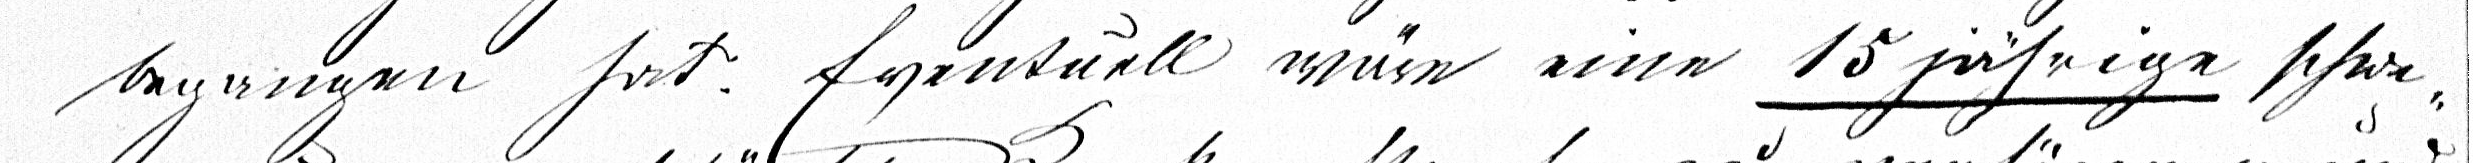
begangen hat. Eventuell wäre eine 15 jährige schwe¬
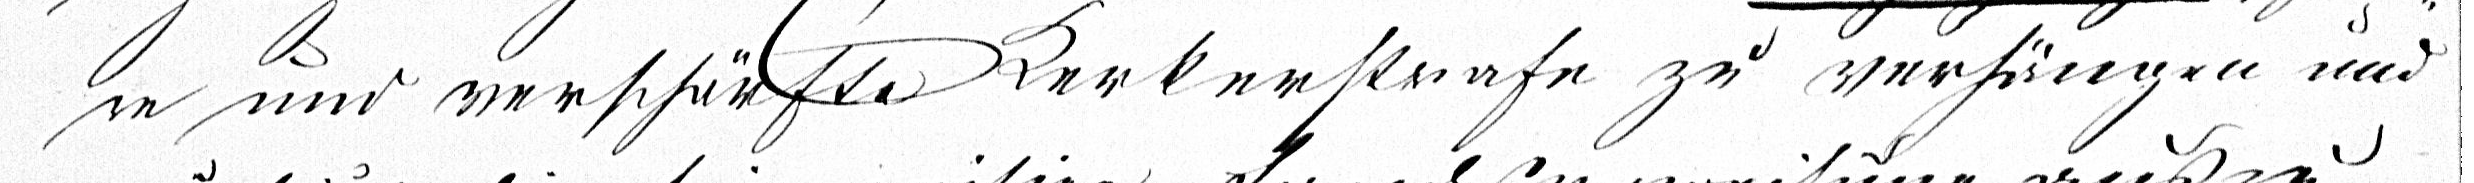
re und verschürfte Kerkerstrafe zu verhängen und
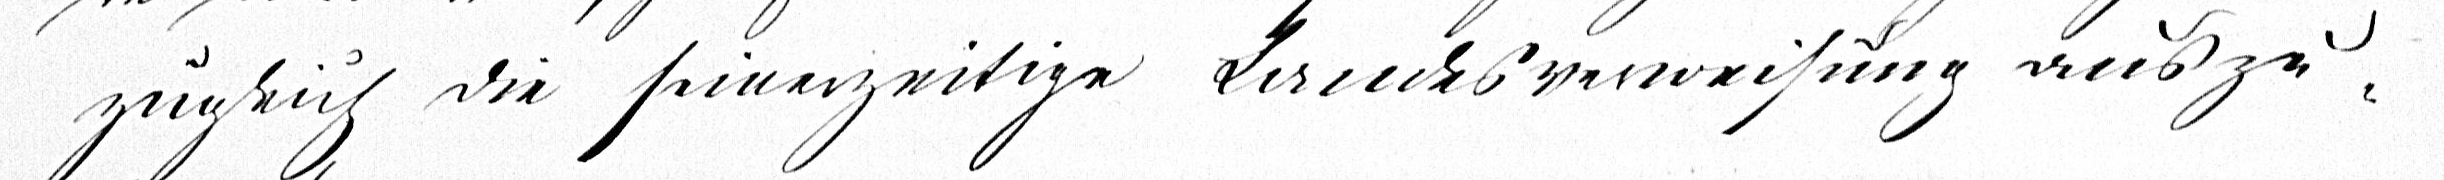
zugleich die seinezeitige Landesverweisung auszu¬
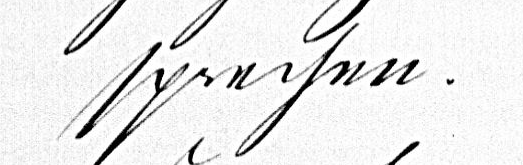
sprechen.
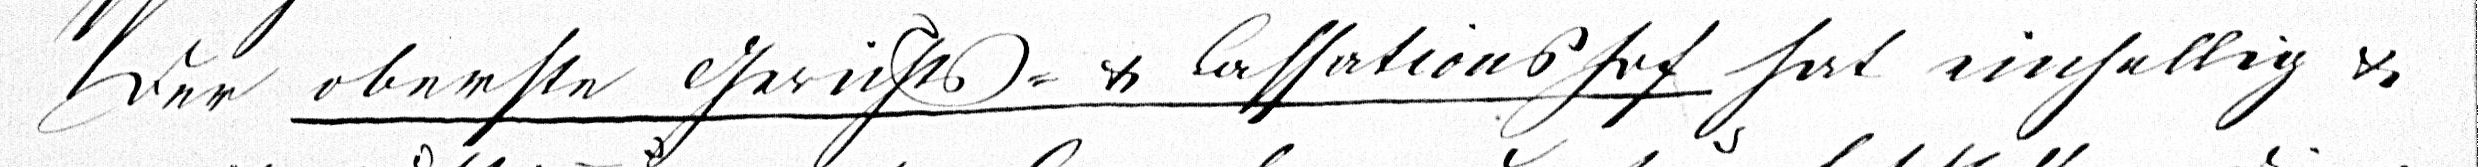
Der oberste Gerichts - er Cassationshof hat einhellig &
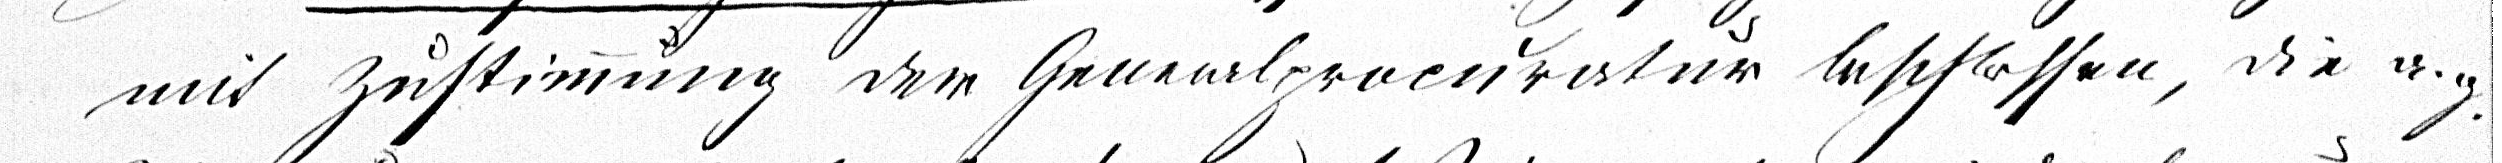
mit Zustimmung der Generalprocuratur leschxxssen, die a. g.
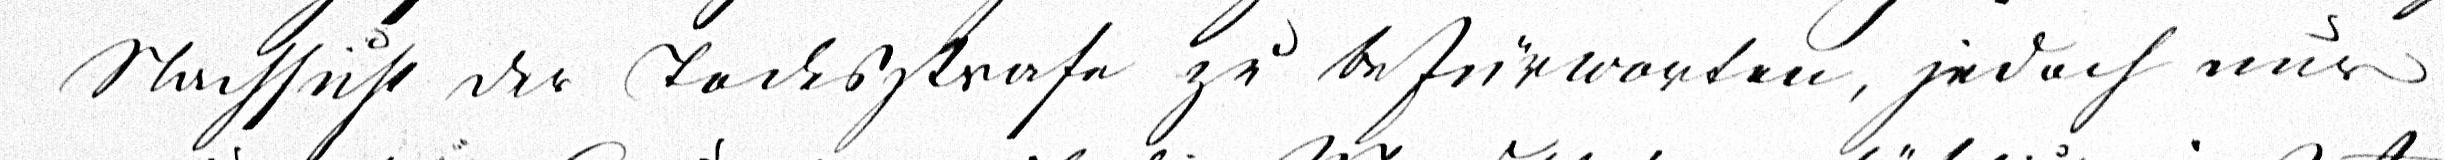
Nachsicht der Todesstrafe zu befürworten, jedoch nur
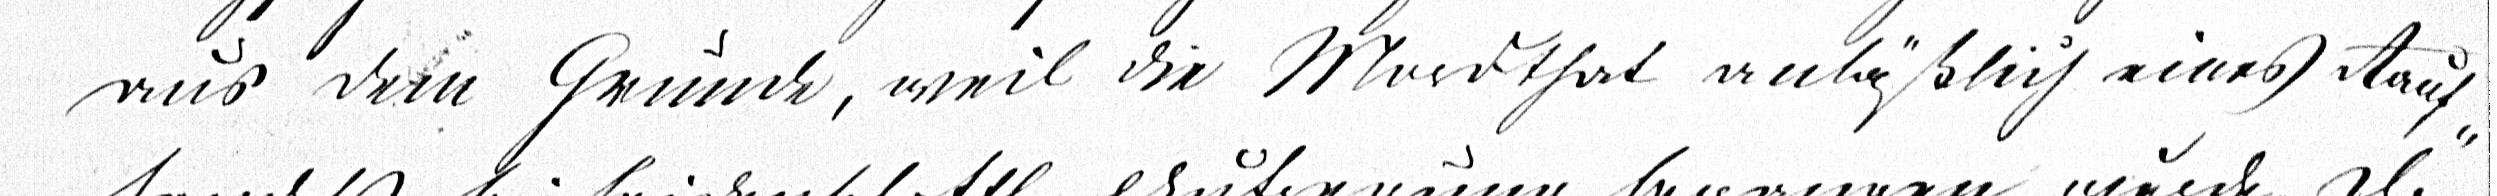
aus dem Grunde, weil die Mordthat anläßlich eines Aauf¬
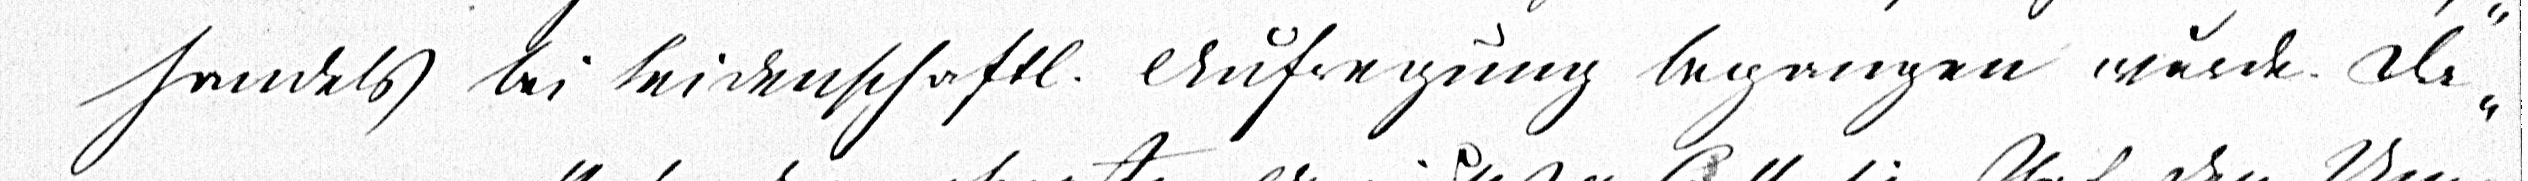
handels bei leidenschaftl. Aufregung begangen wurck. Da¬
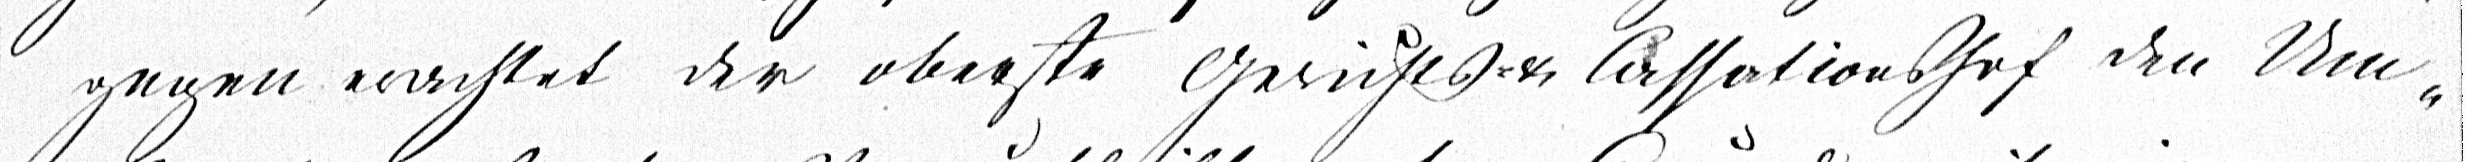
gegen erachtet der oberste Gerichts- & Cassationshof den Um¬
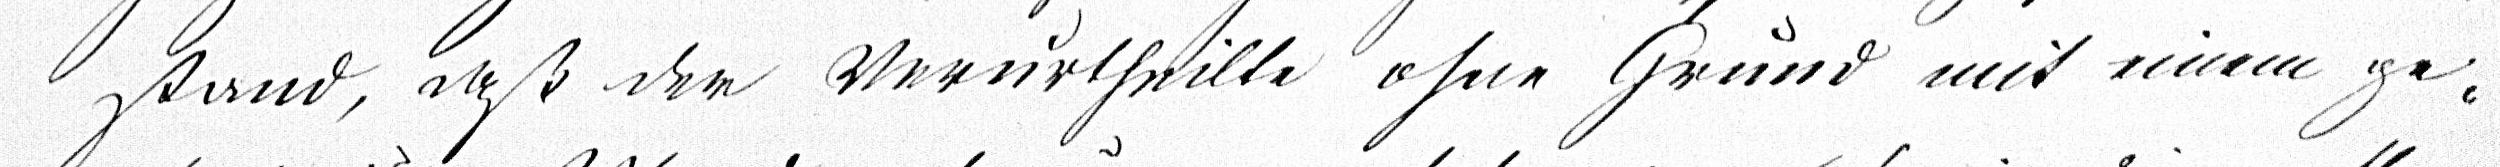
stand, daß der verurtheilte ohne Grund mit einem ge¬
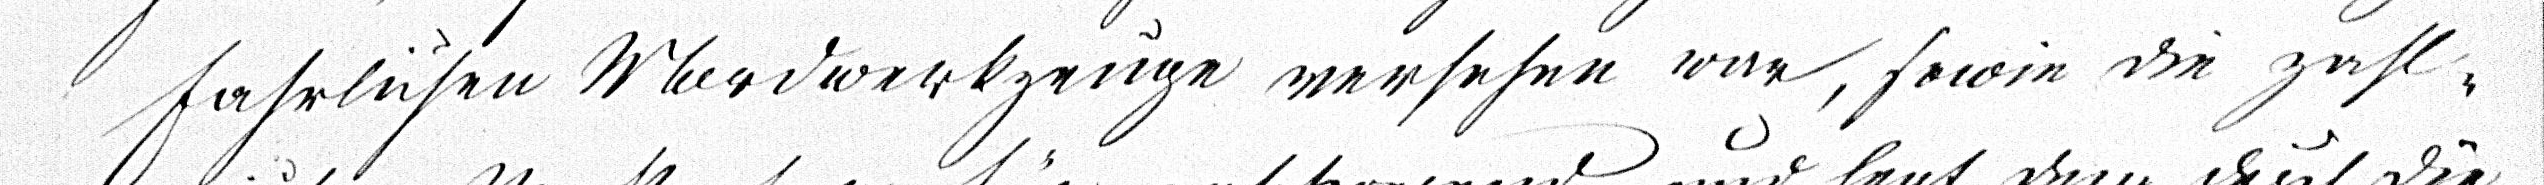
fahrlxxsen Mordwerkzeuge versehen vor, sowie die zahl¬
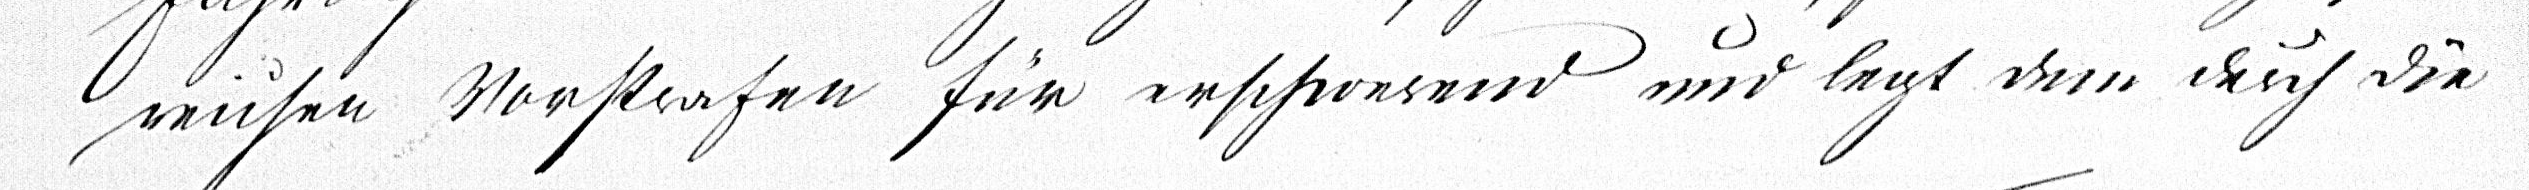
reichen Vorstrafen für erschwerend und legt den durch die
